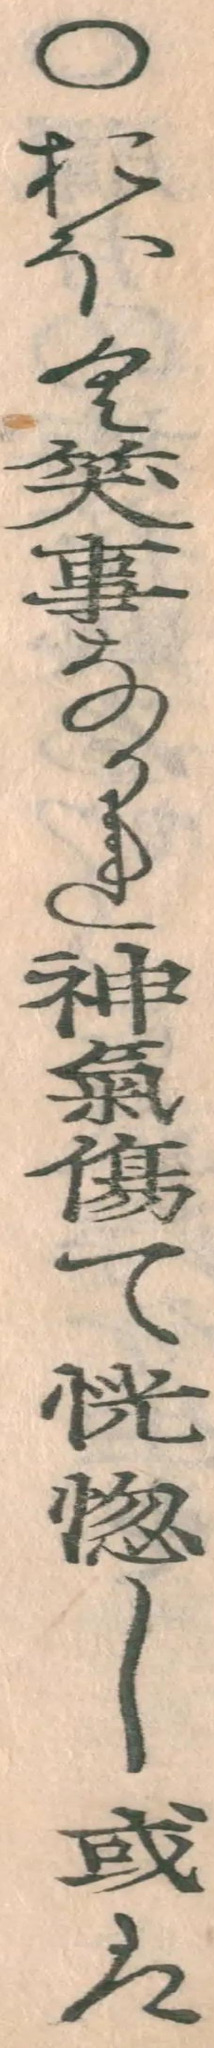〇おほく笑事なかれ神気傷て恍惚し或は
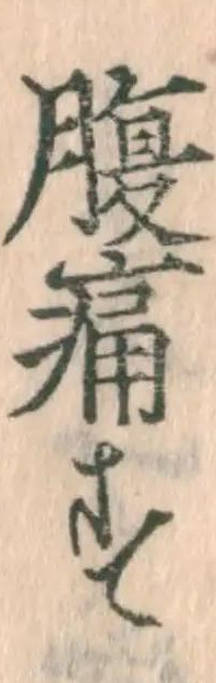腹痛す
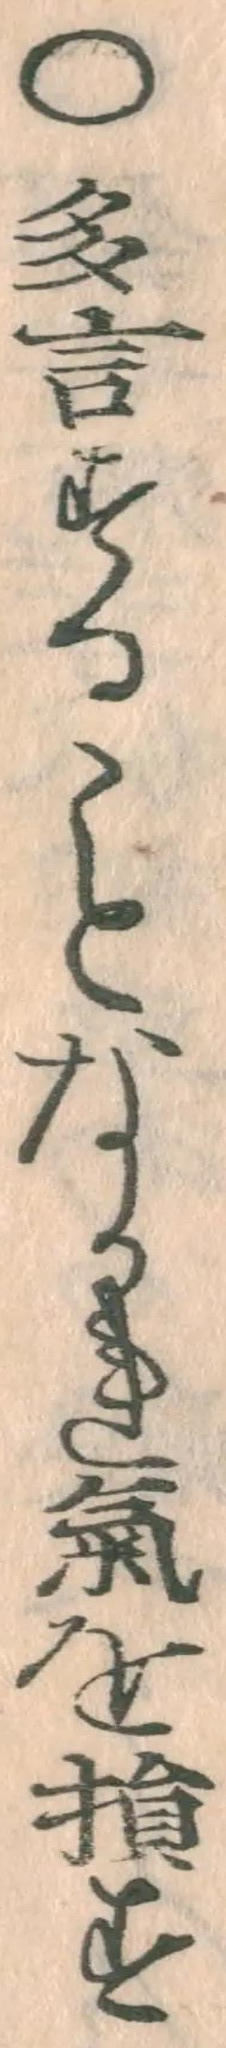〇多言することなかれ気を損す
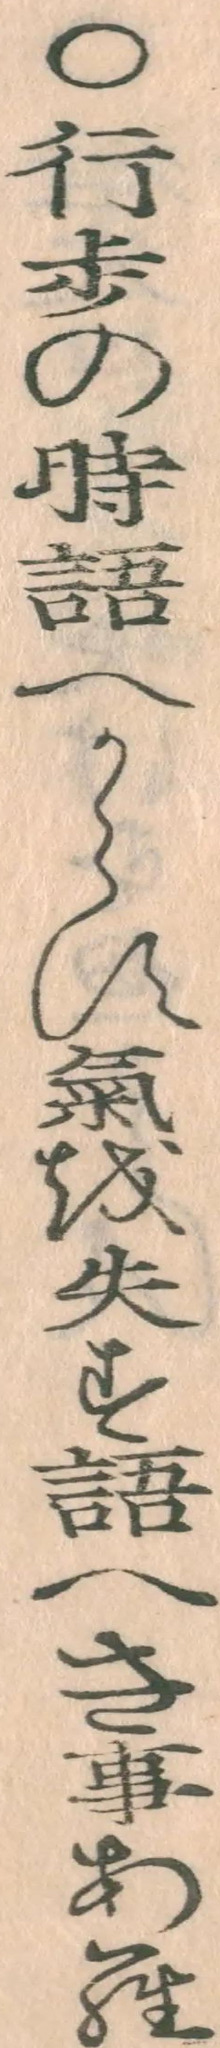〇行歩の時語へからす気を失す語へき事あら
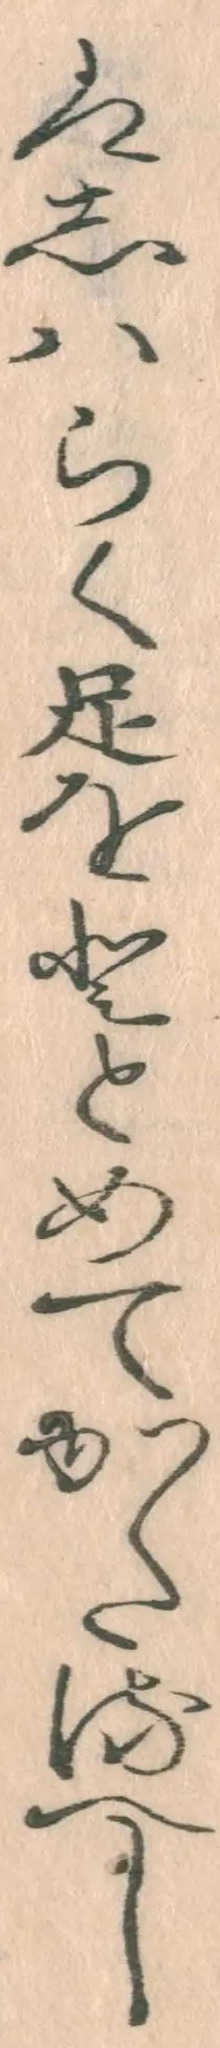はしはらく足をととめてかたるへし
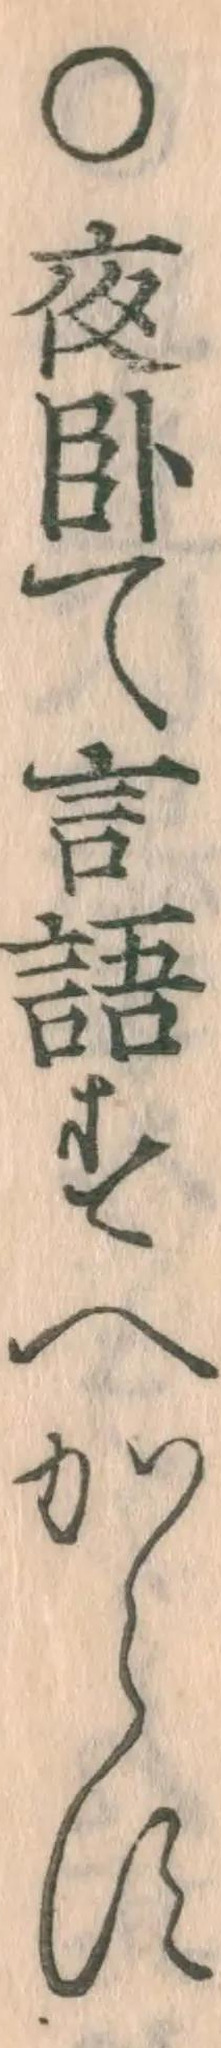〇夜臥て言語すへからす
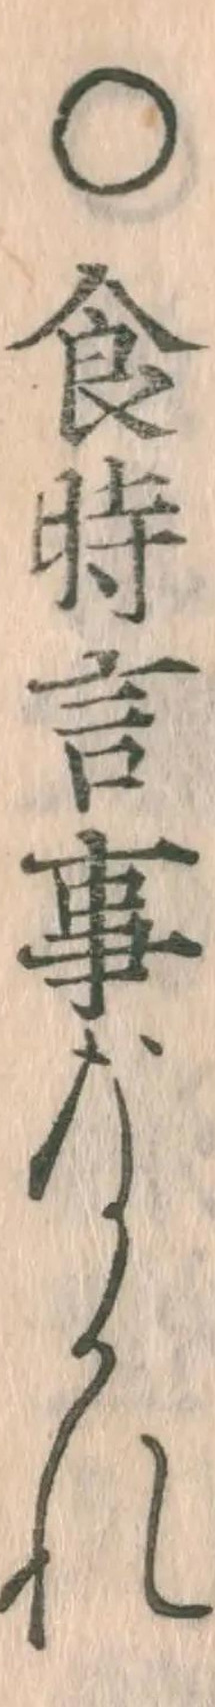〇食時言事なかれ
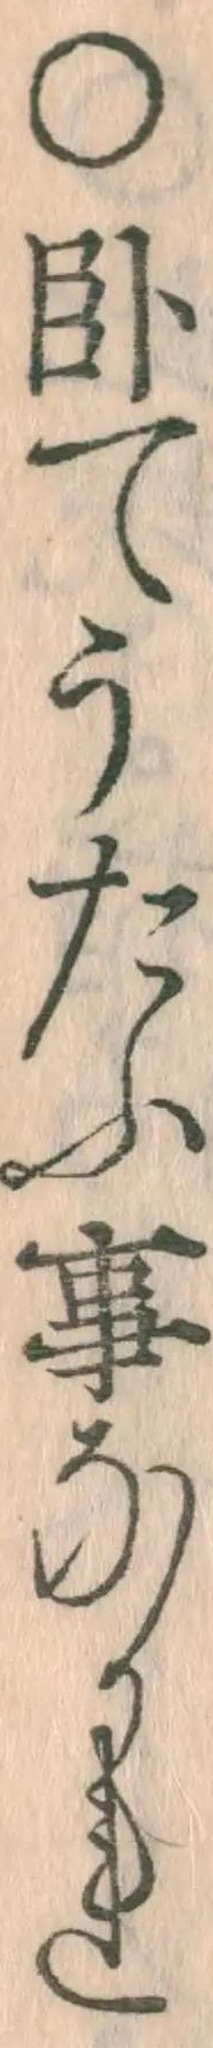〇臥てうたふ事なかれ
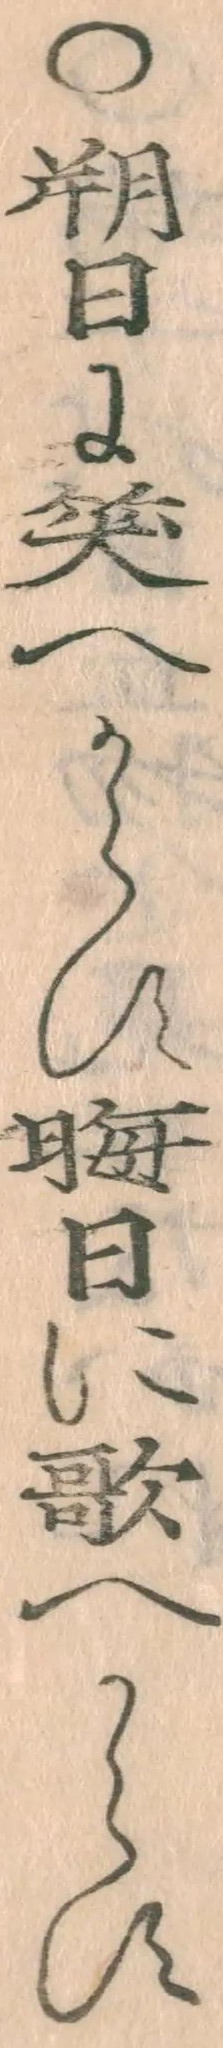〇朔日に笑へからす晦日に歌へからす
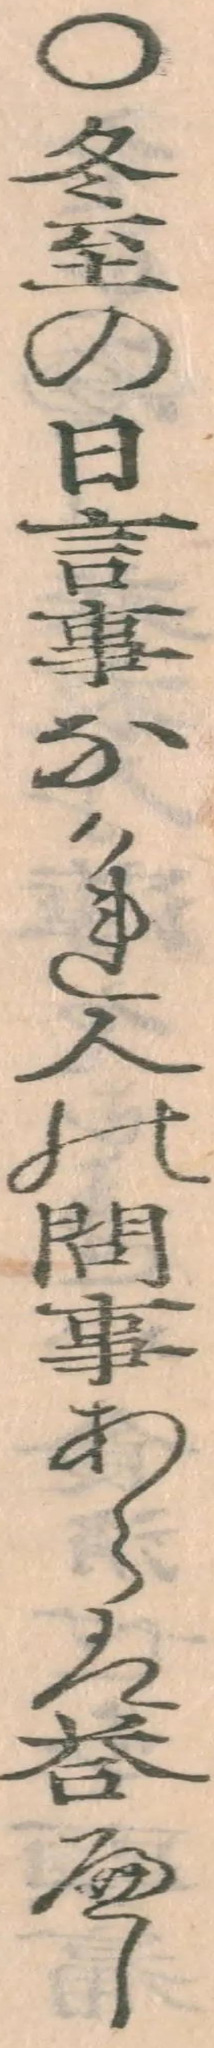〇冬至の日言事なかれ人の問事あらは答へし
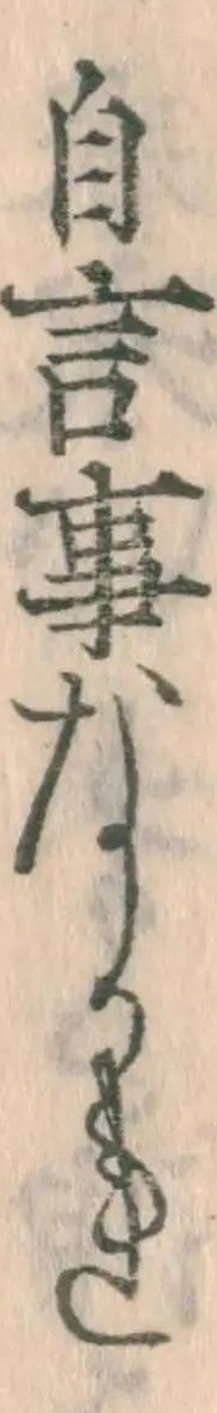自言事なかれ
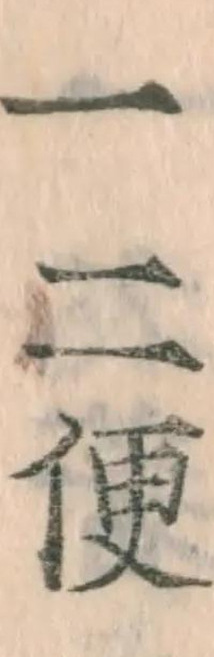一二便
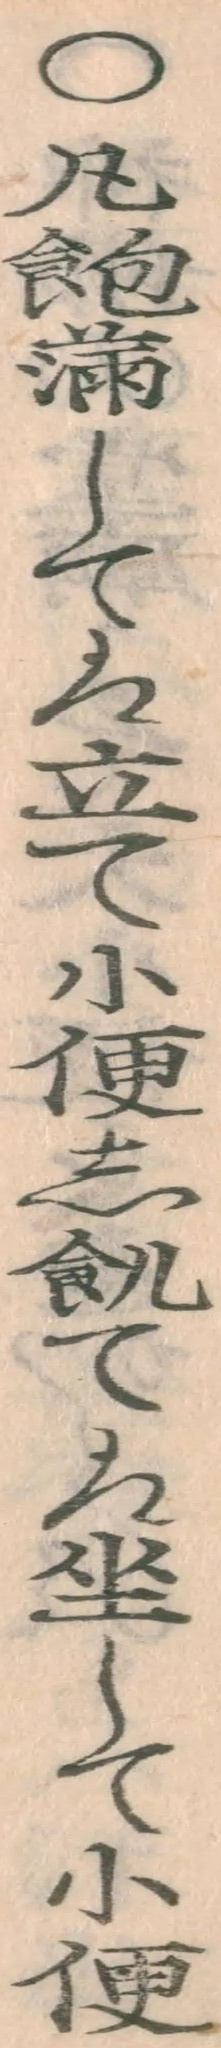〇凡飽満しては立て小便し飢ては坐して小便
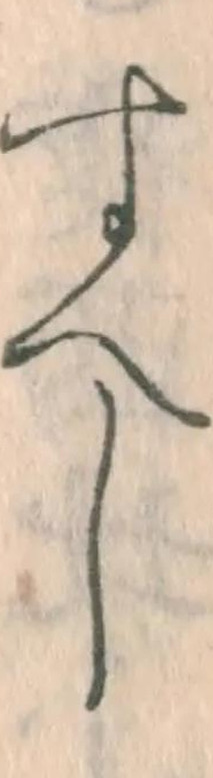すへし
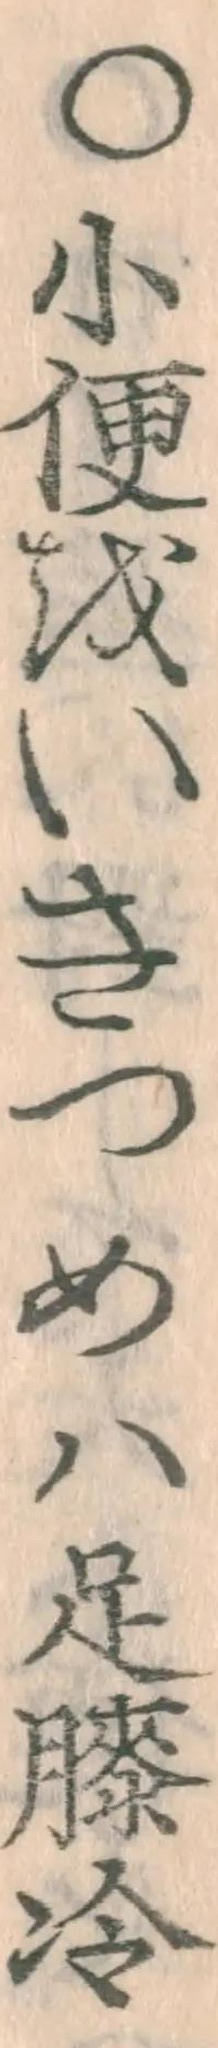〇小便をいきつめは足膝冷
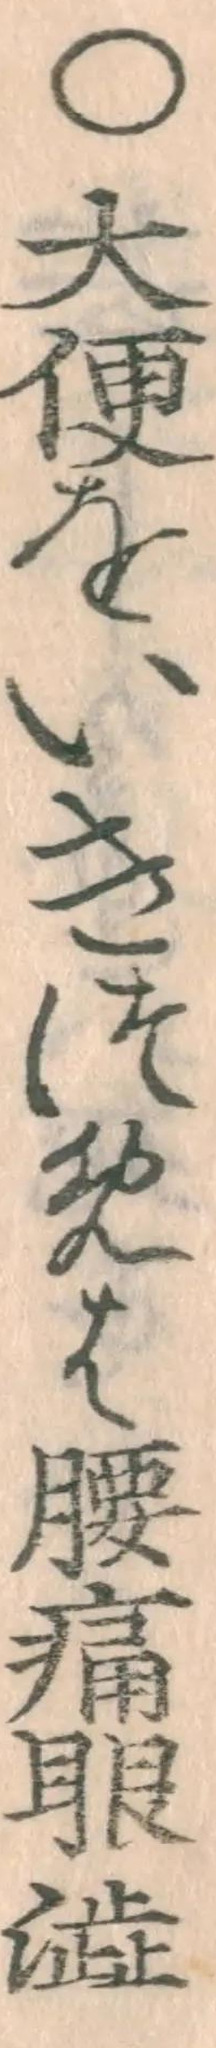〇大便をいきつめは腰痛眼渋
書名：延壽撮要
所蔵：国立国会図書館 National Diet Library, JAPAN
